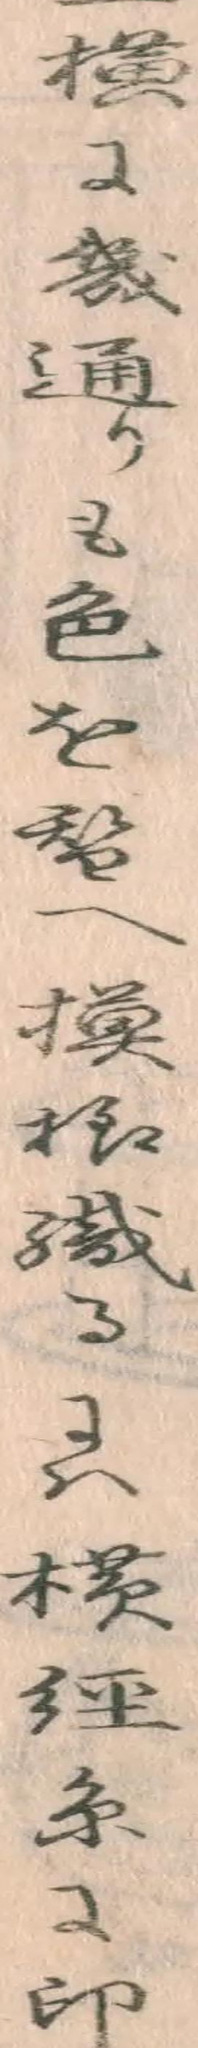一横に幾通りも色を替へ模様織るには横経糸に印
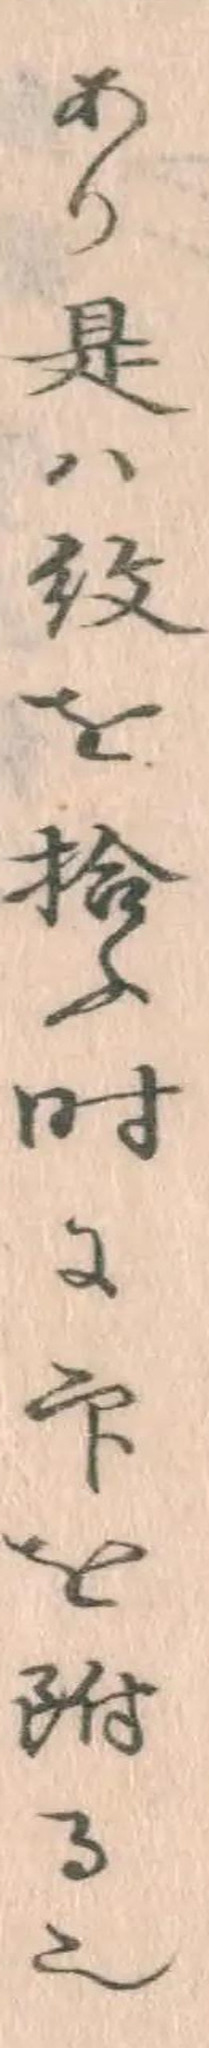あり是は紋を拾ふ時に印を附る也
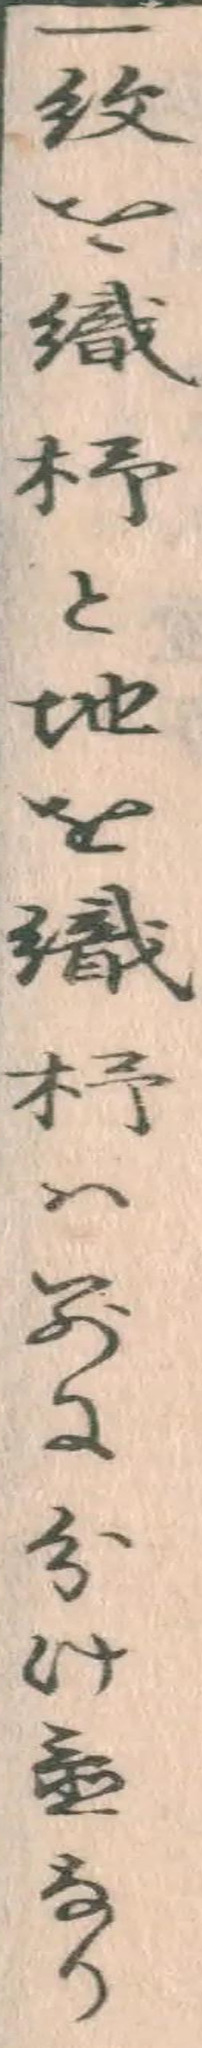一紋を織杼と地を織杼は別に分け置なり
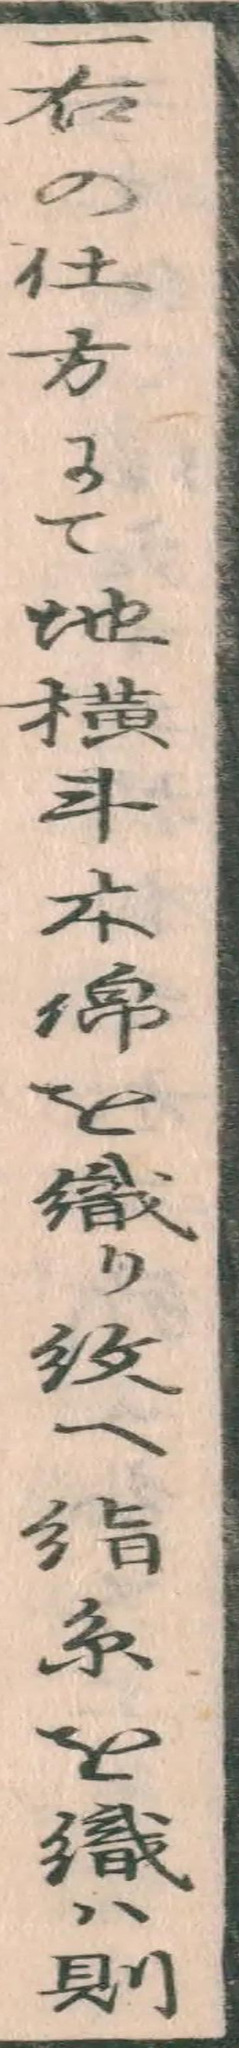一右の仕方にて地横斗木綿を織り紋へ𥿻糸を織は則
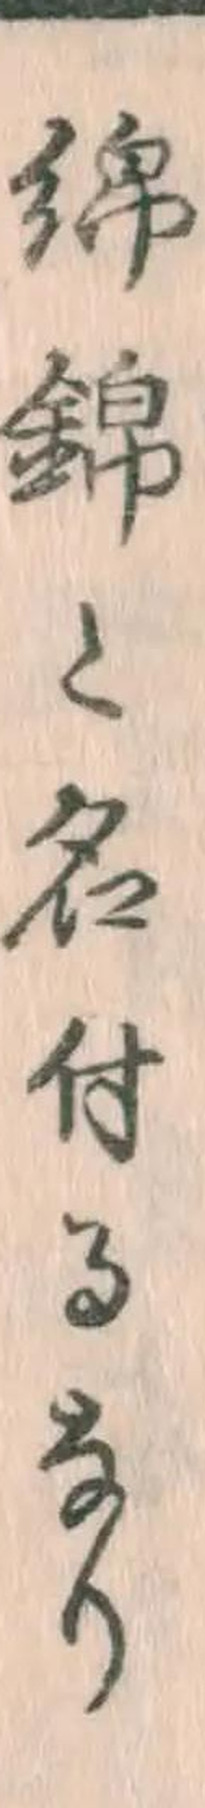綿錦と名付るなり
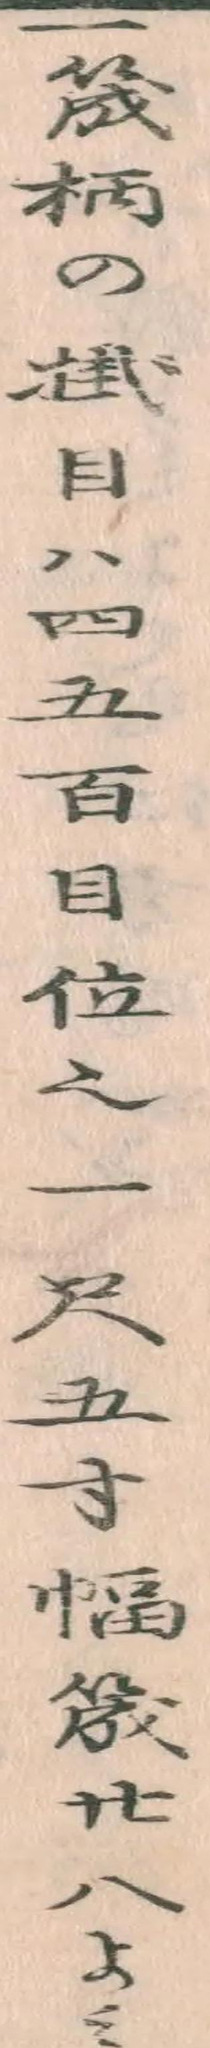一筬柄の掛目は四五百目位也一尺五寸幅筬廿八よみ
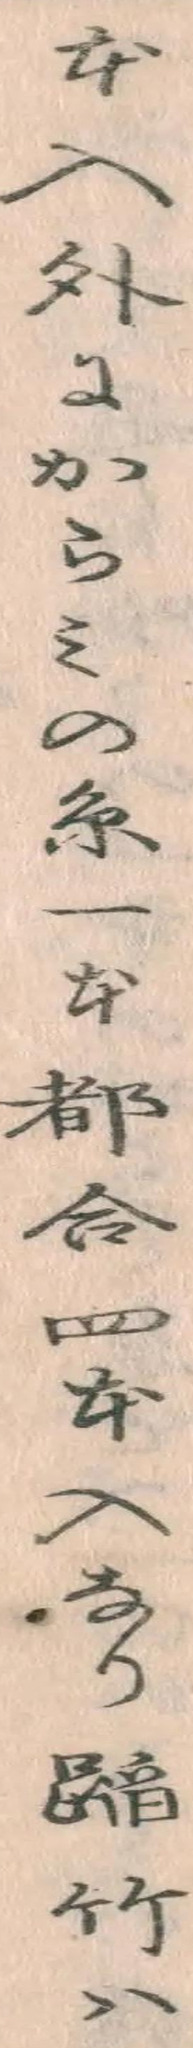本入外にからみの糸一本都合四本入なり蹈竹は
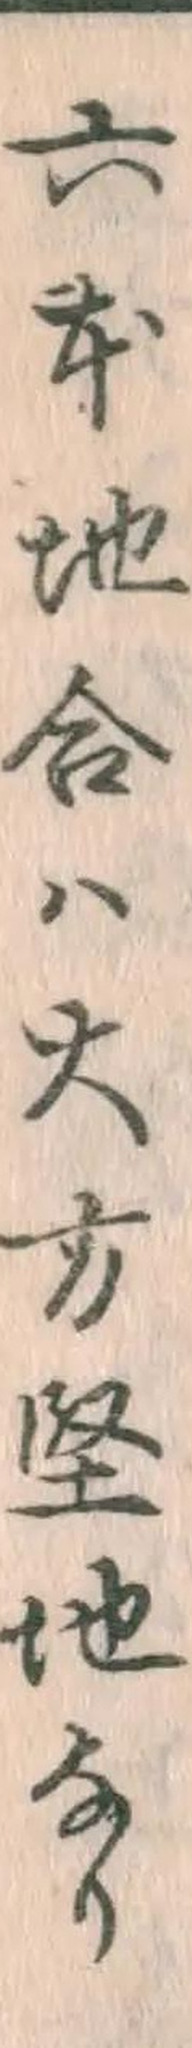六本地合は大方堅地なり
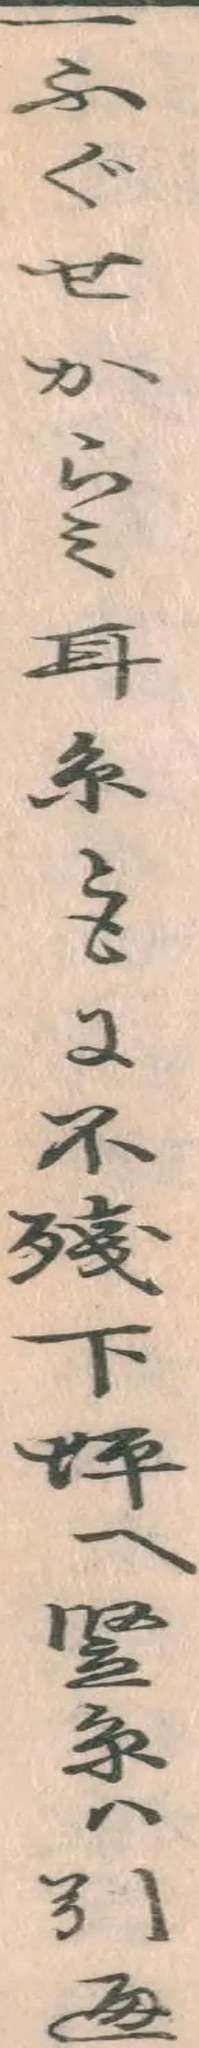一ふぐせからみ耳糸ともに不残下坪へ竪糸は引通
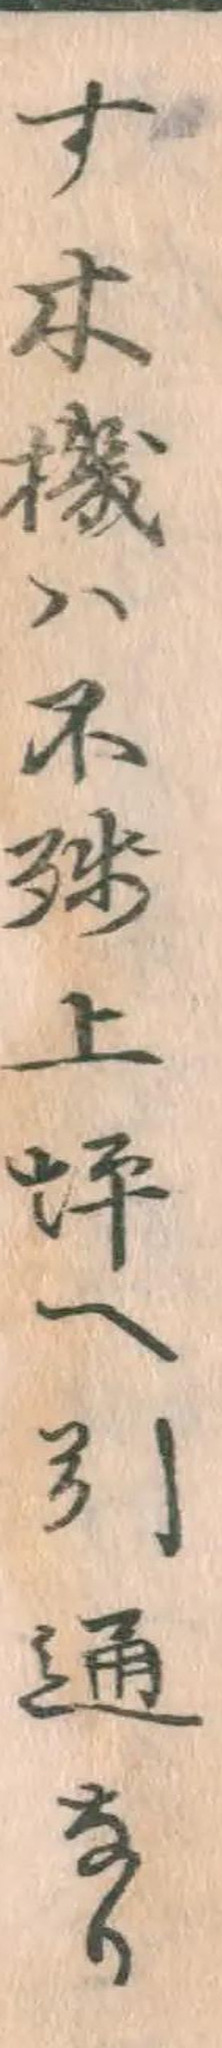す木機は不残上坪へ引通なり
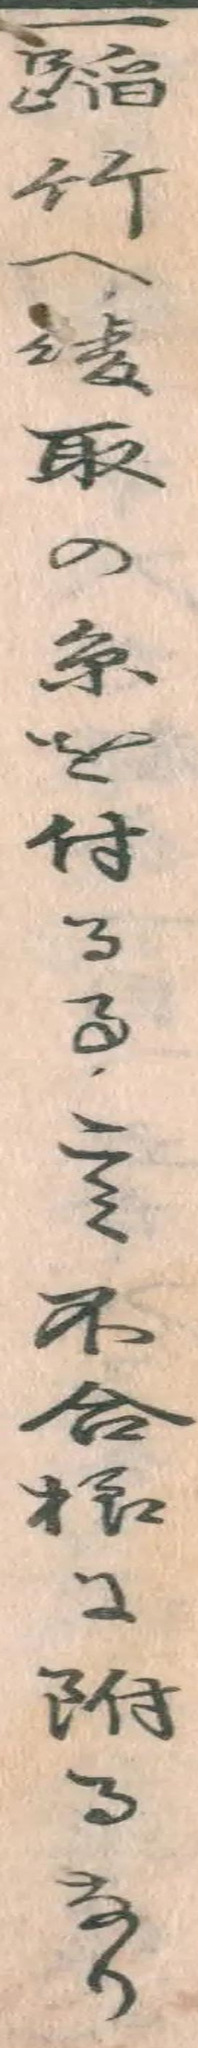一蹈竹へ綾取の糸を付る事こみ不合様に附るなり
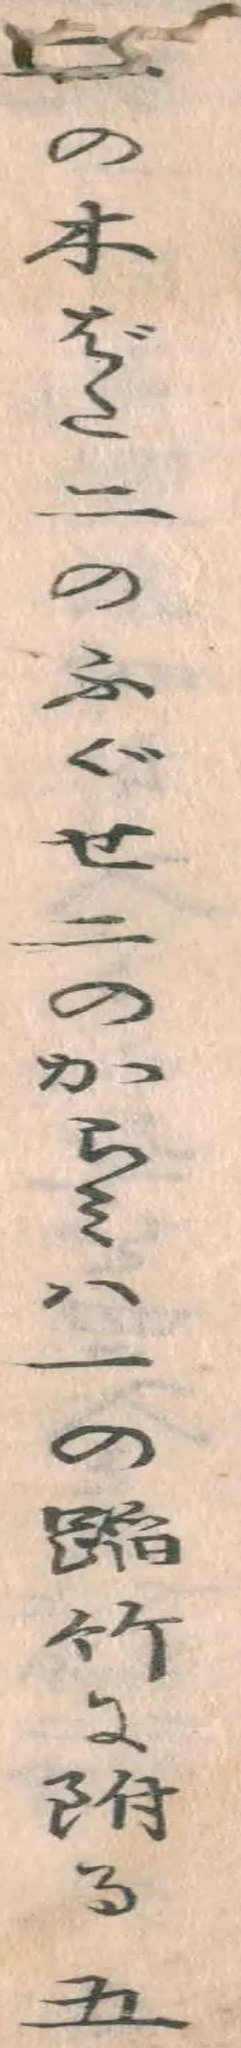二の木ばた二のふぐせ二のからみは一の蹈竹に附る五
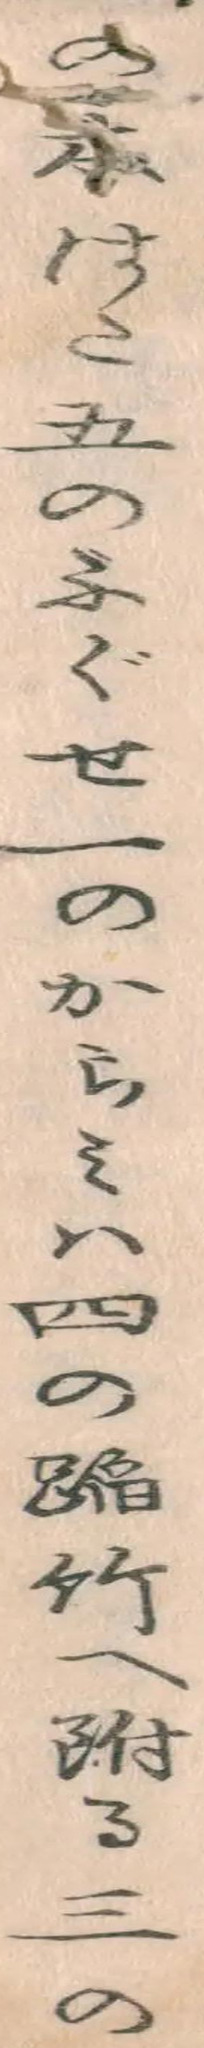の木はた五のふぐせ一のからみは四の蹈竹へ附る三の
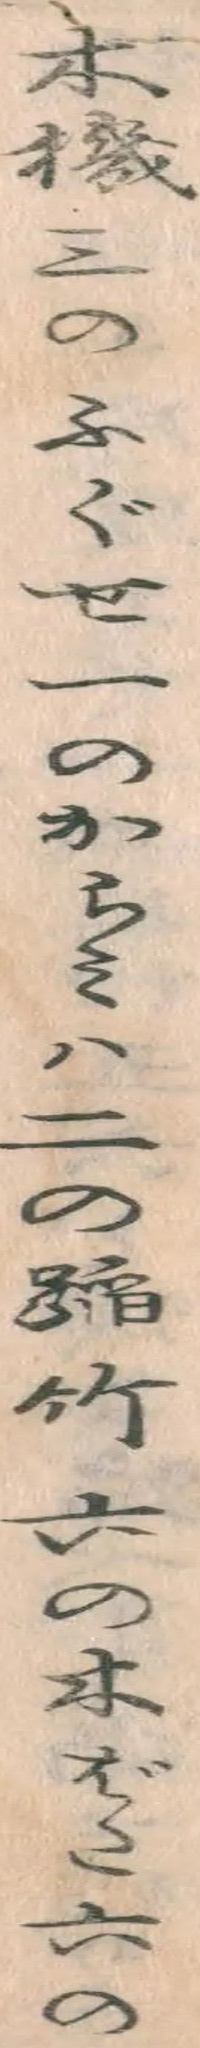木機三のふぐせ一のからみは二の蹈竹六の木ばた六の
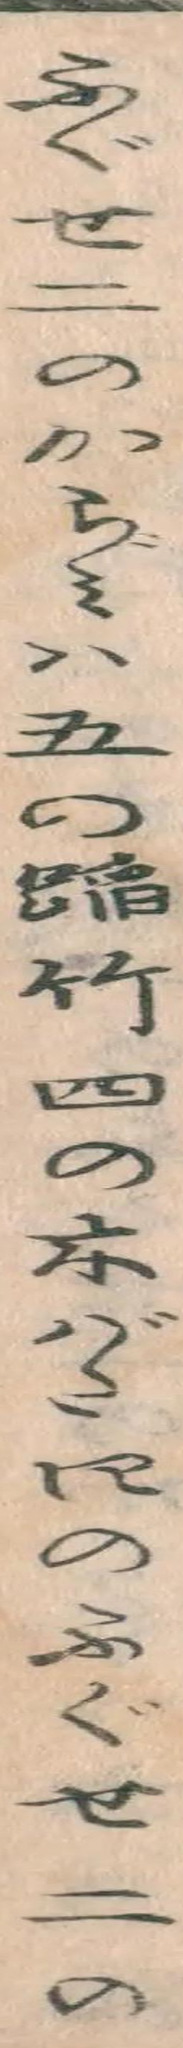ふぐせ二のからみは五の蹈竹四の木ばた四のふぐせ二の

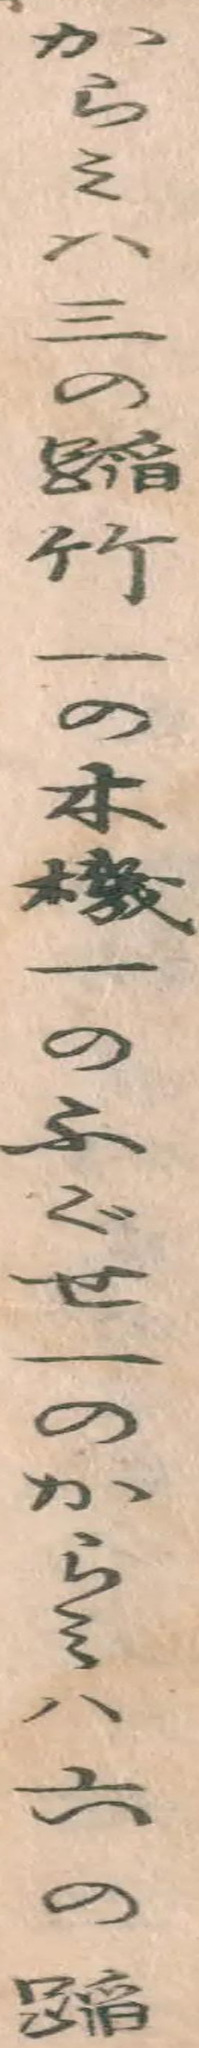からみは三の蹈竹一の木機一のふぐせ一のからみは六の蹈
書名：機織彙編 5巻. [2]
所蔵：国立国会図書館 National Diet Library, JAPAN
